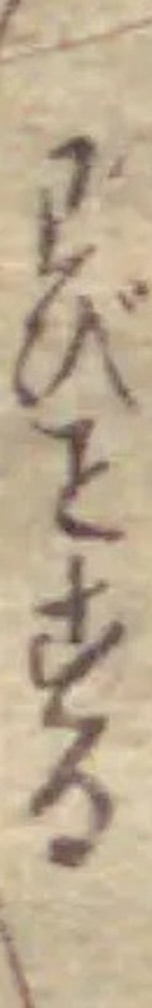わびをする
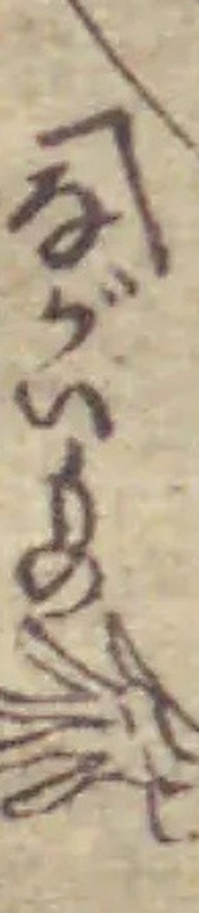〽ながいもの
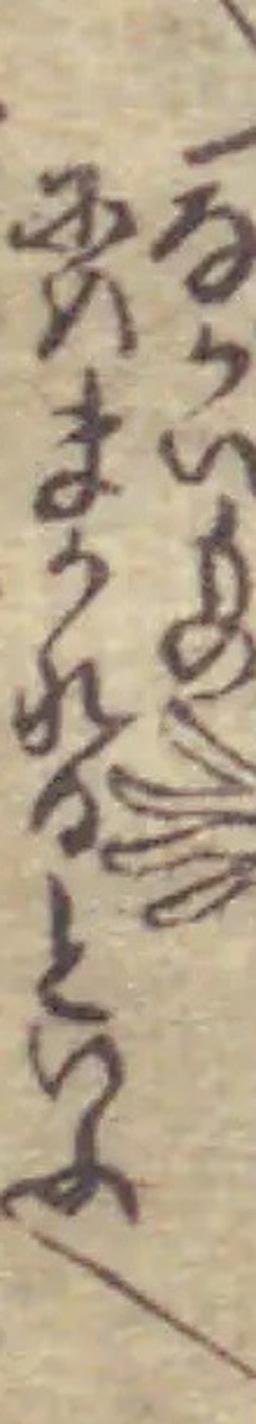にはまかれるといふ
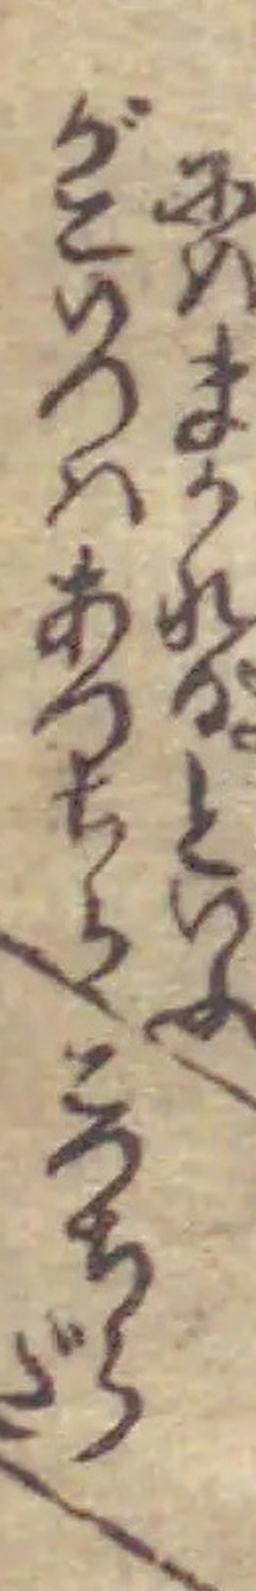がこいつはあつちらこつちら

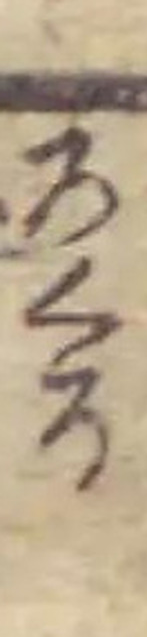ろくろ
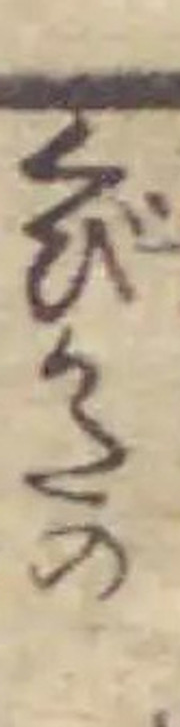くびかたの
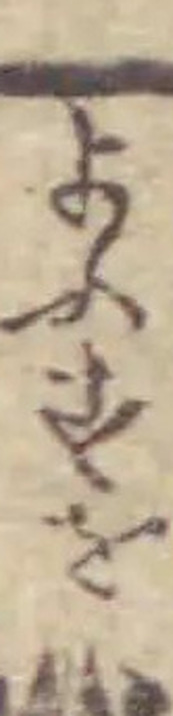よふすを
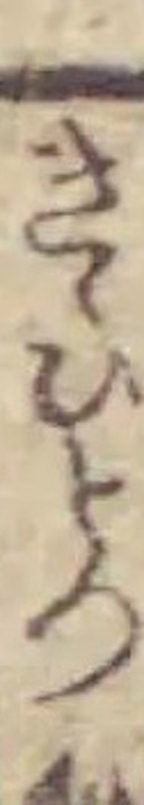きゝひとつ
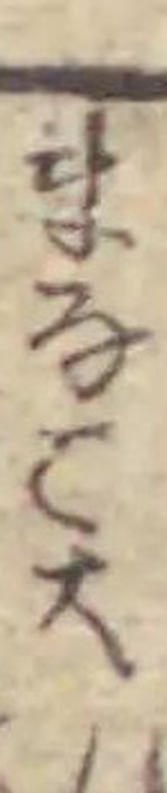まなこ大
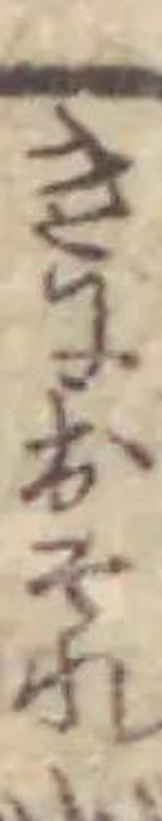きにおそれ
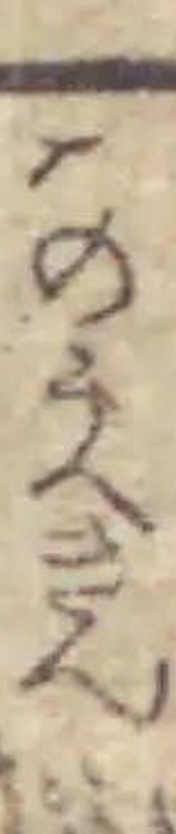このうへきん
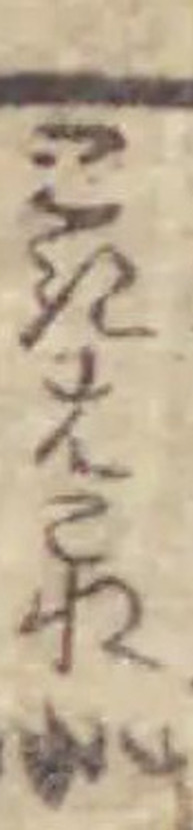ときはこね
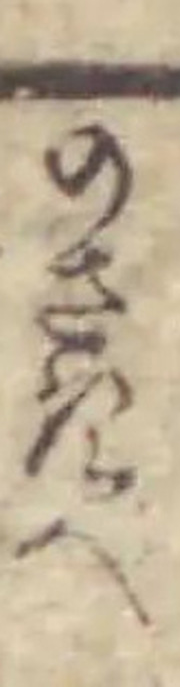のさきへ
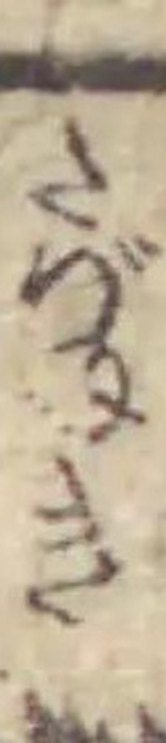たづねき
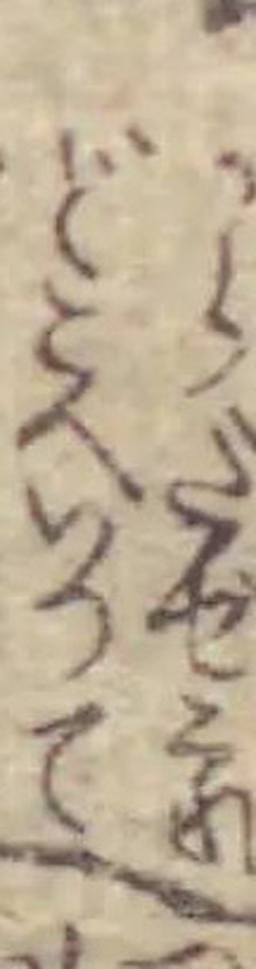どこへいつても
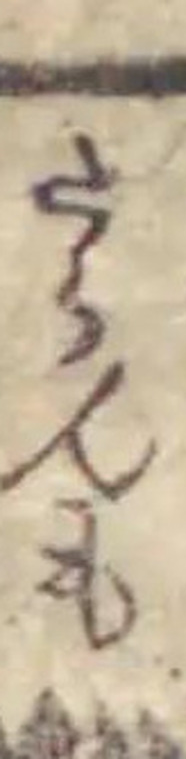たらんも
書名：化物敵討 2巻
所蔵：国立国会図書館 National Diet Library, JAPAN
